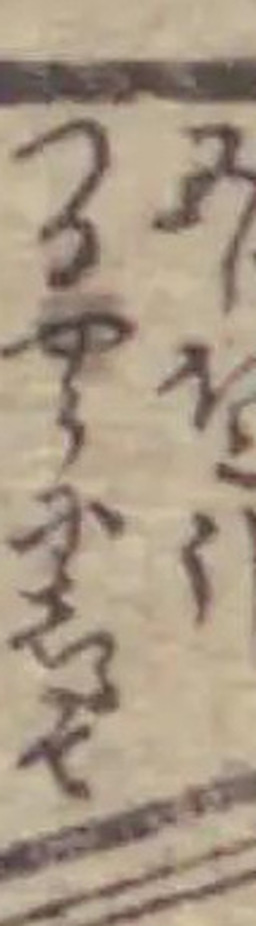つるやうにしたて
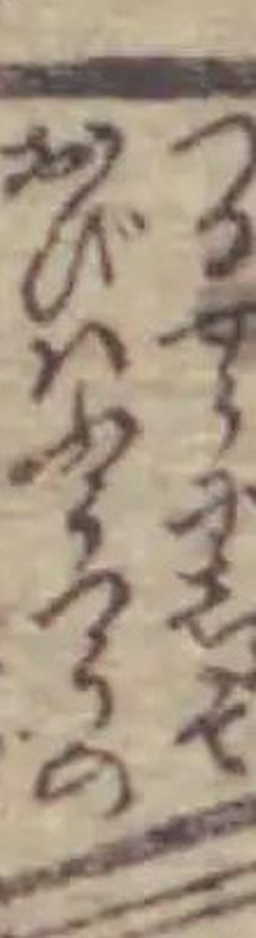おびはふうつうの
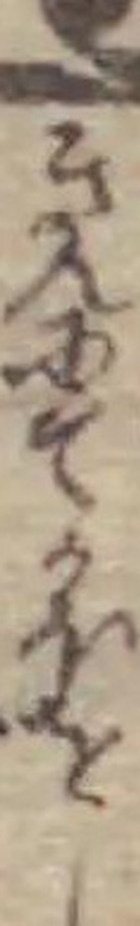きんにてかほを
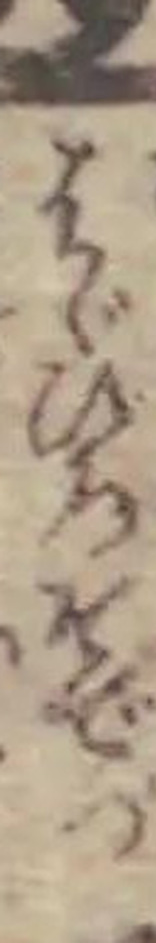はゞひろそでづ
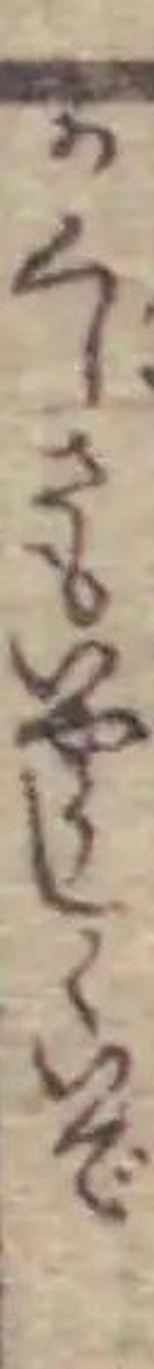かくしさもいやうしくいで
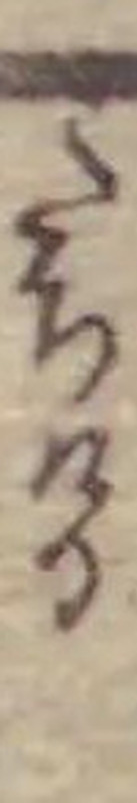たちける
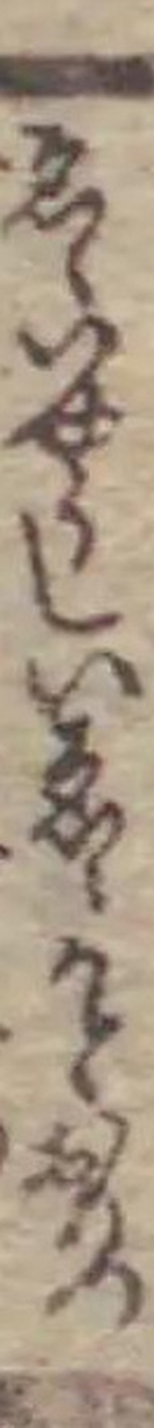ゑゝいやうしいゑゝかとおもつ
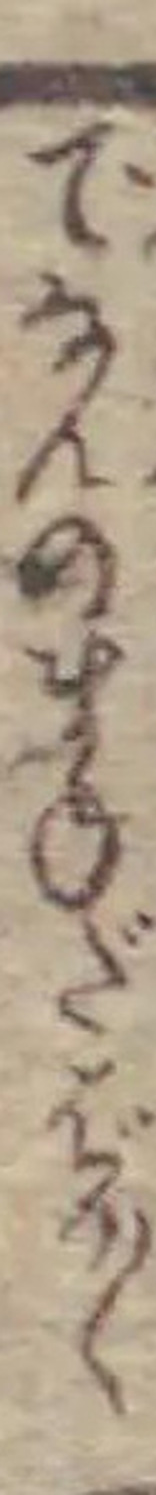てなんのまねだばか〳〵
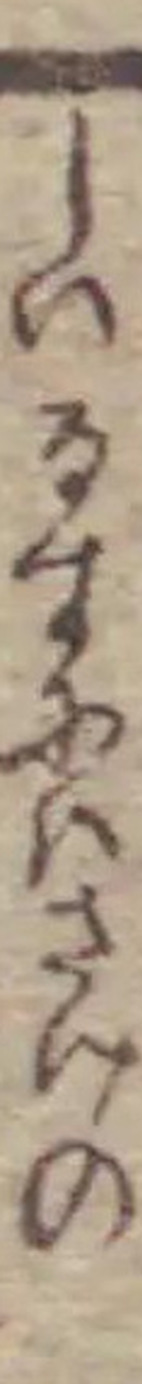しいるすにはさけの
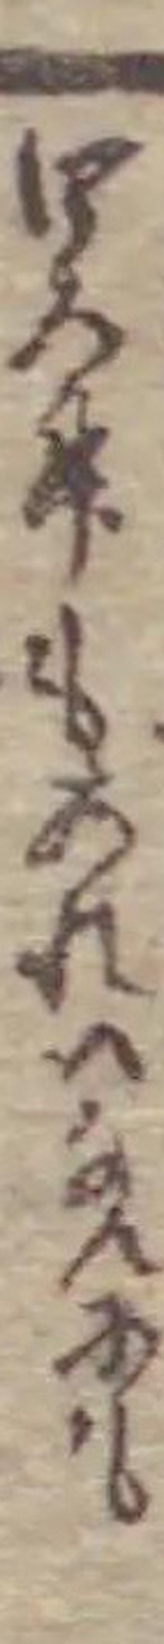四五升もあれはなんにも
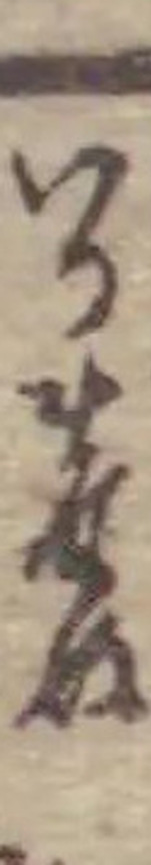いりませぬ
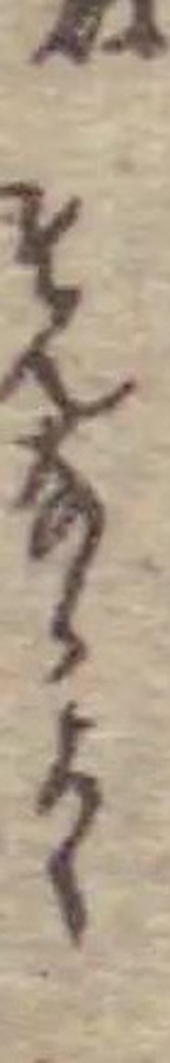そんならよく
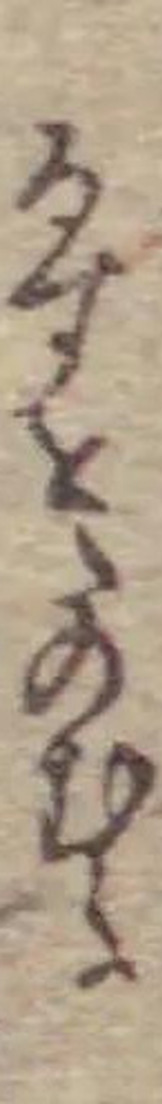るすをたのむよ
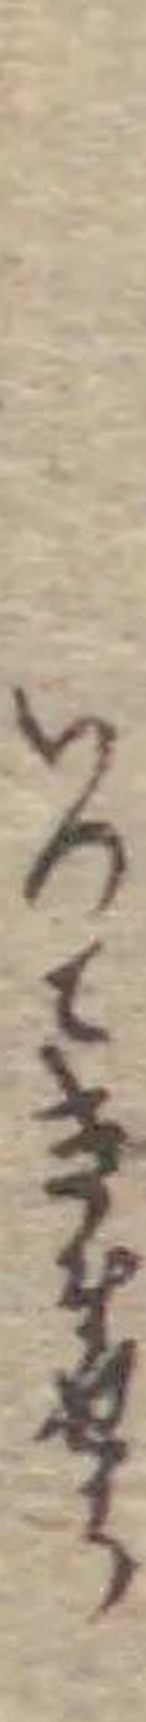いつてきませう
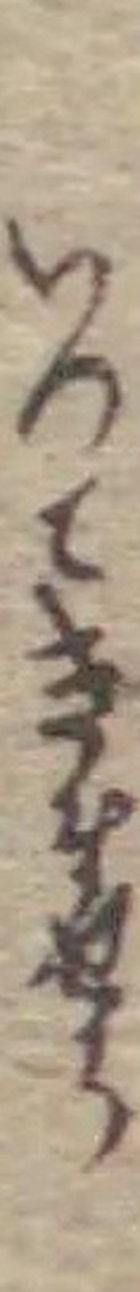いつてきませう
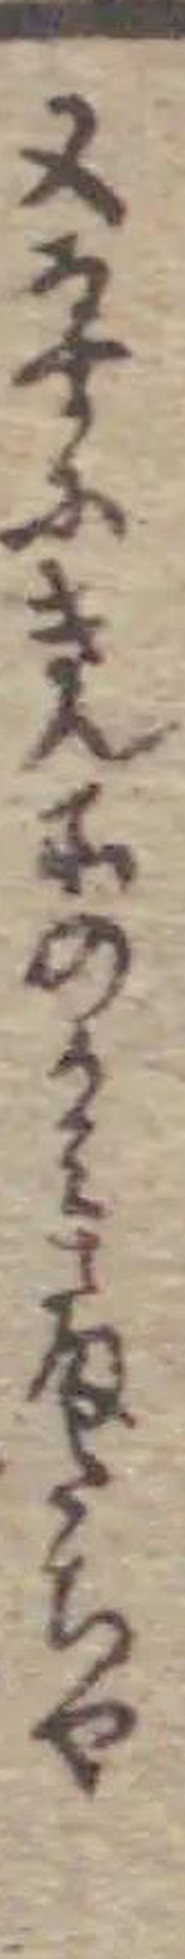又るすにきん所のかみさまたちや
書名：飛た間違矢口噂 2巻
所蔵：国立国会図書館 National Diet Library, JAPAN
